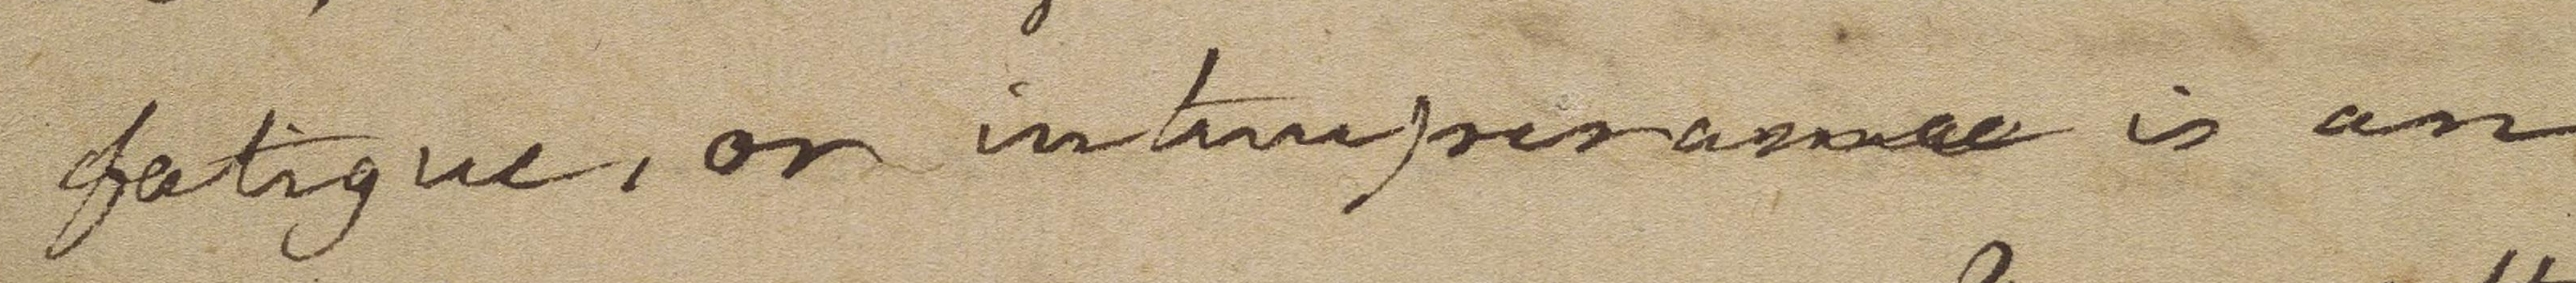fatigue, or intemperance is an
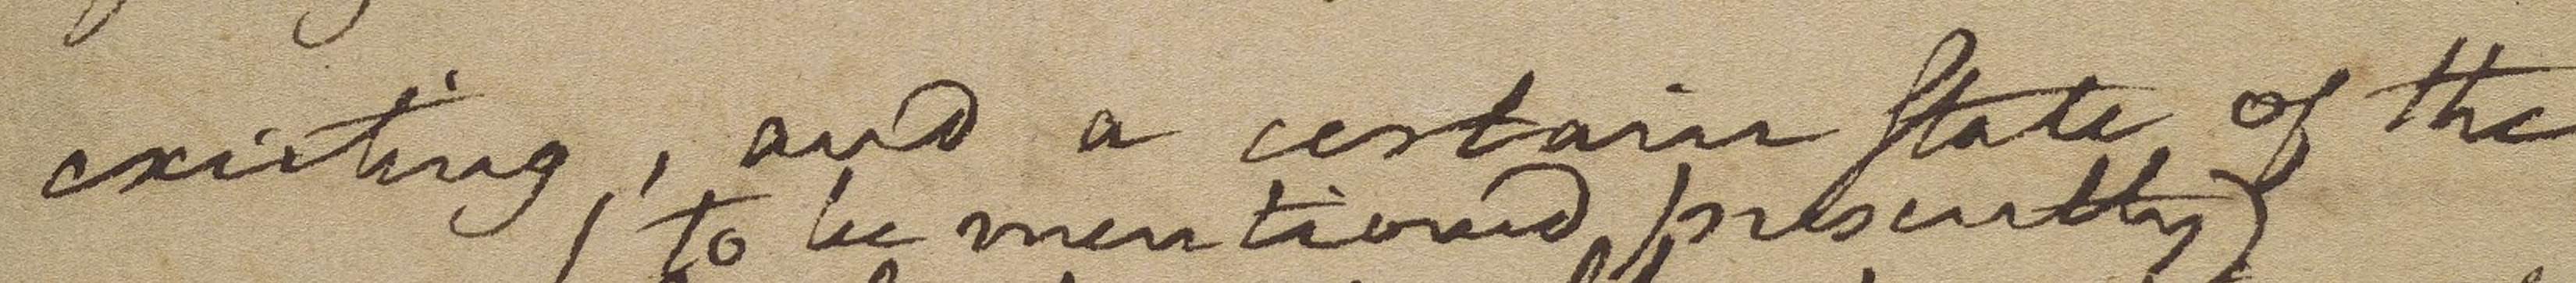exciting, and a certain state of the
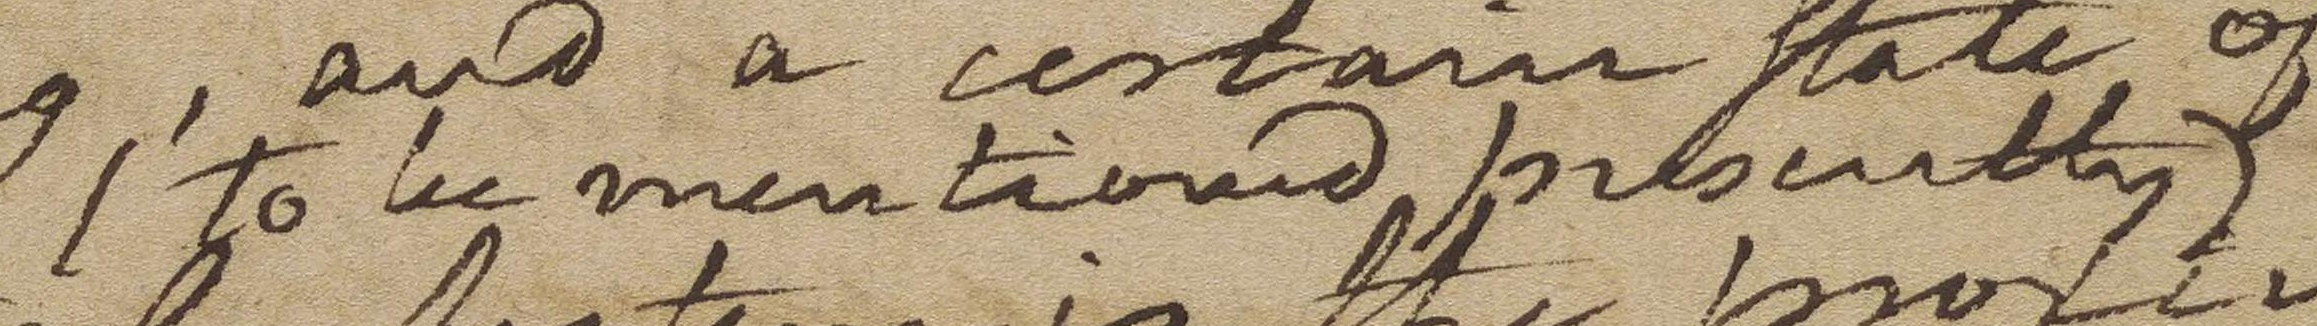(to be mentioned presently)
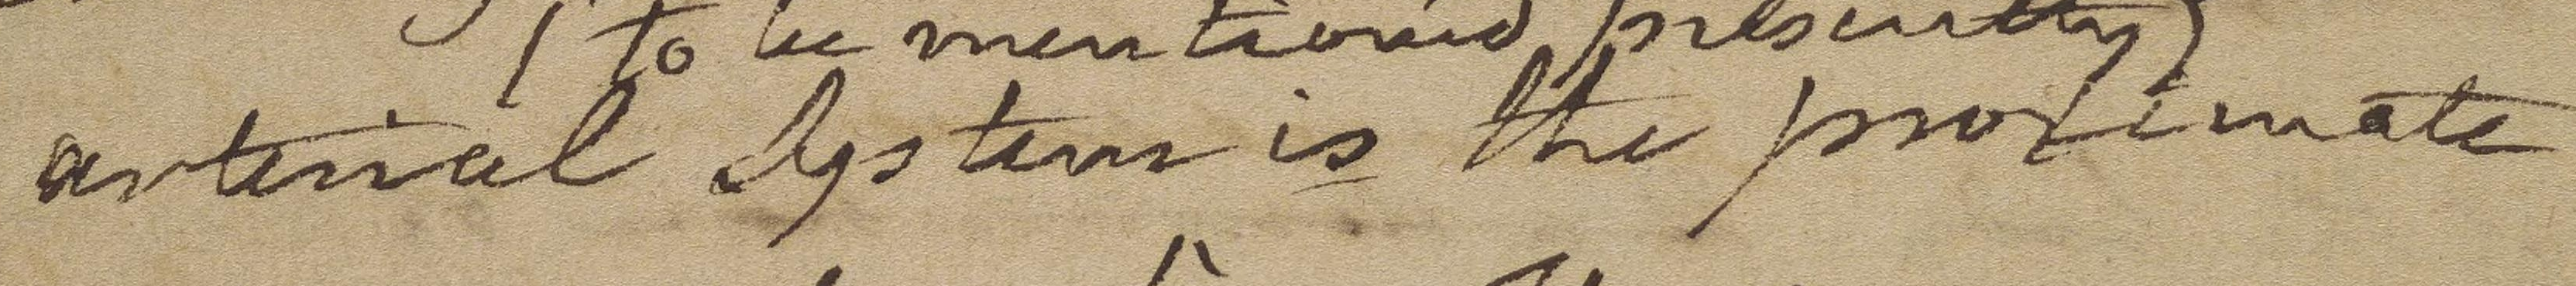arterial systems ^ is the proximate
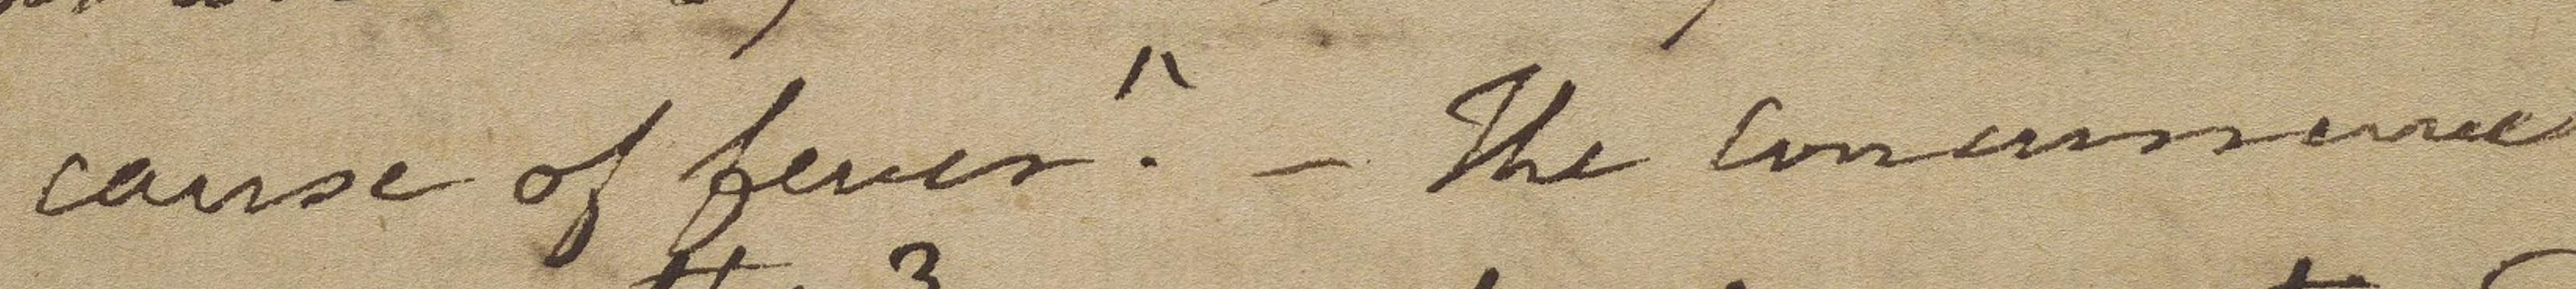cause of fever.- The consequence
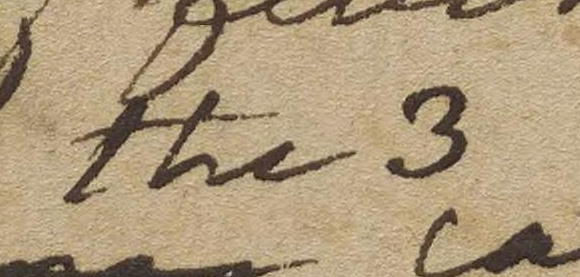the 3
